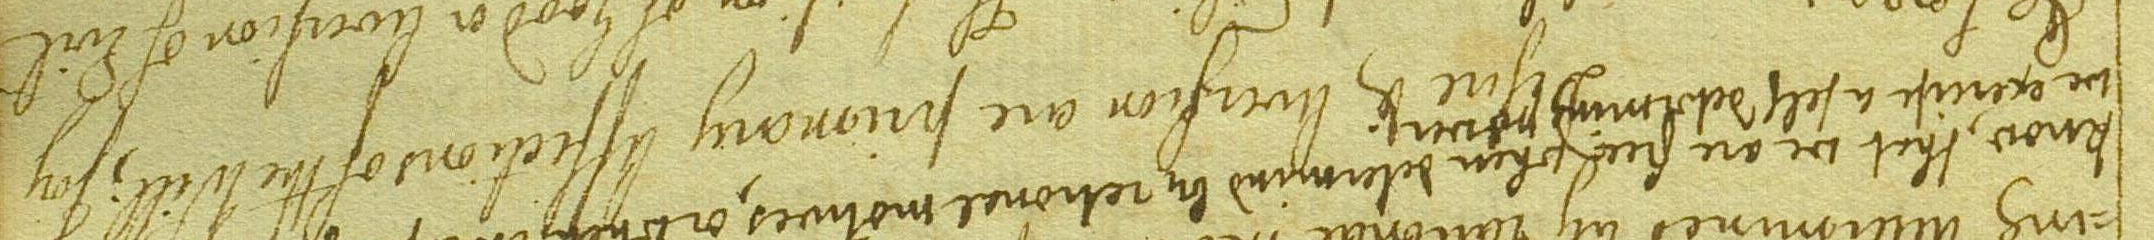we exercise a self determining power. Desire & Aversion are primary affections of the Will; Joy
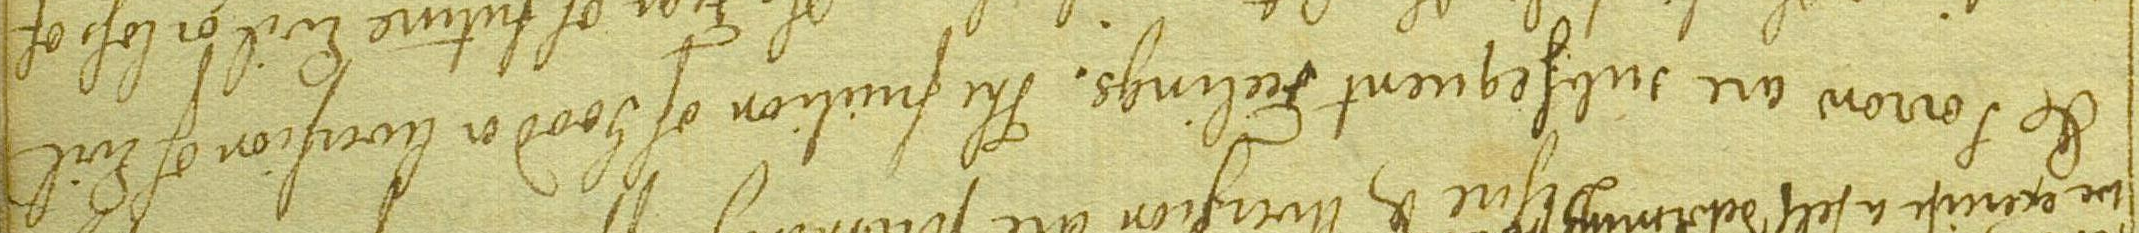& Sorrow are subsequent Feelings. The function of Good or Aversion of Evil
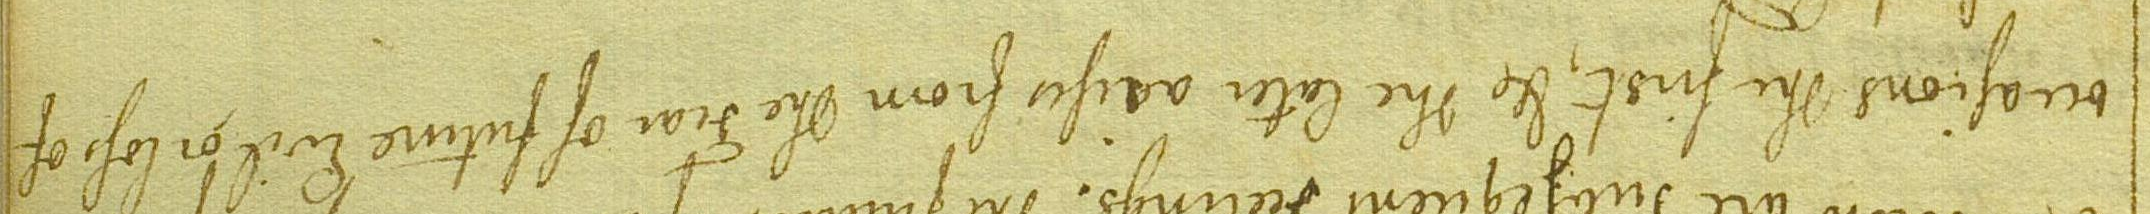occasions the first, & the later arises from the Fear of future Evil or loss of
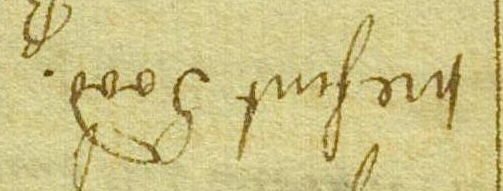present Good.
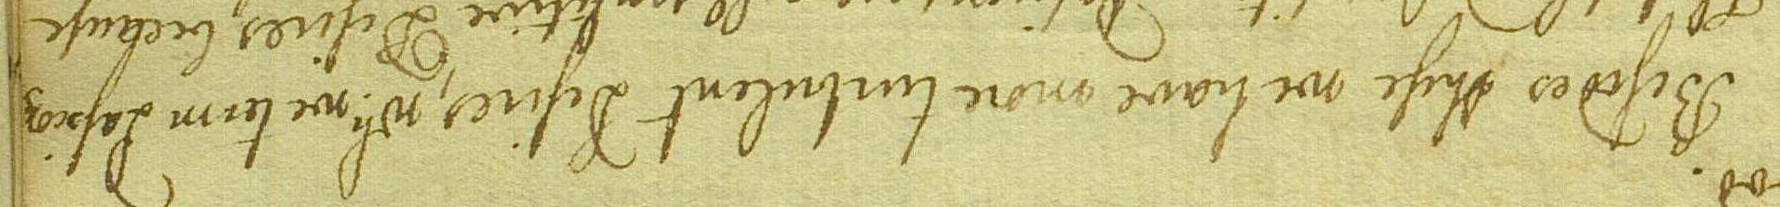Besides these we have more turbulent Desires, w^h. we term Passions
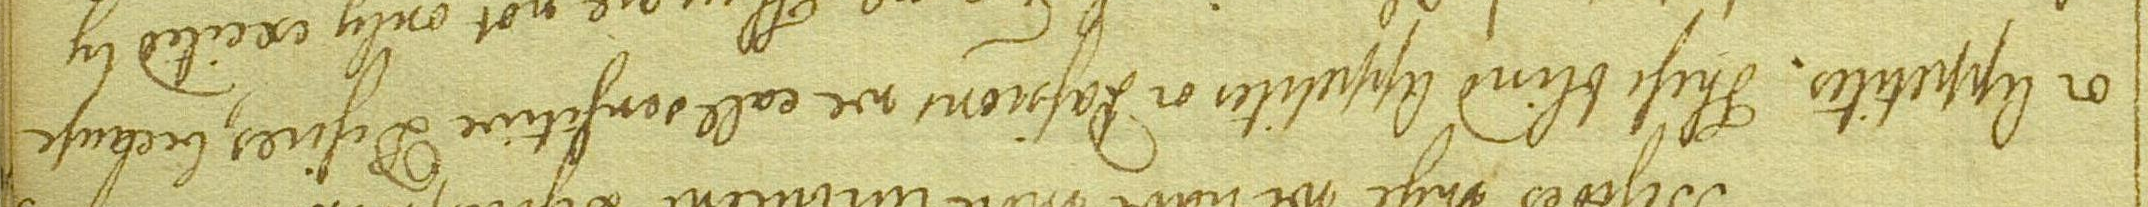or Appetites. These blind Appetites or Passions we call sensitive Desires, because
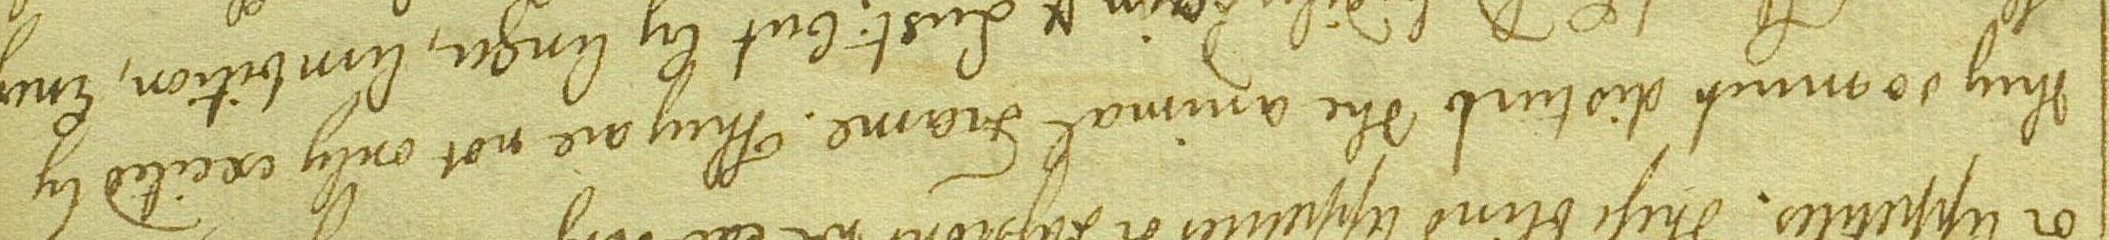they so much disturb the animal Frame. They are not only excited by
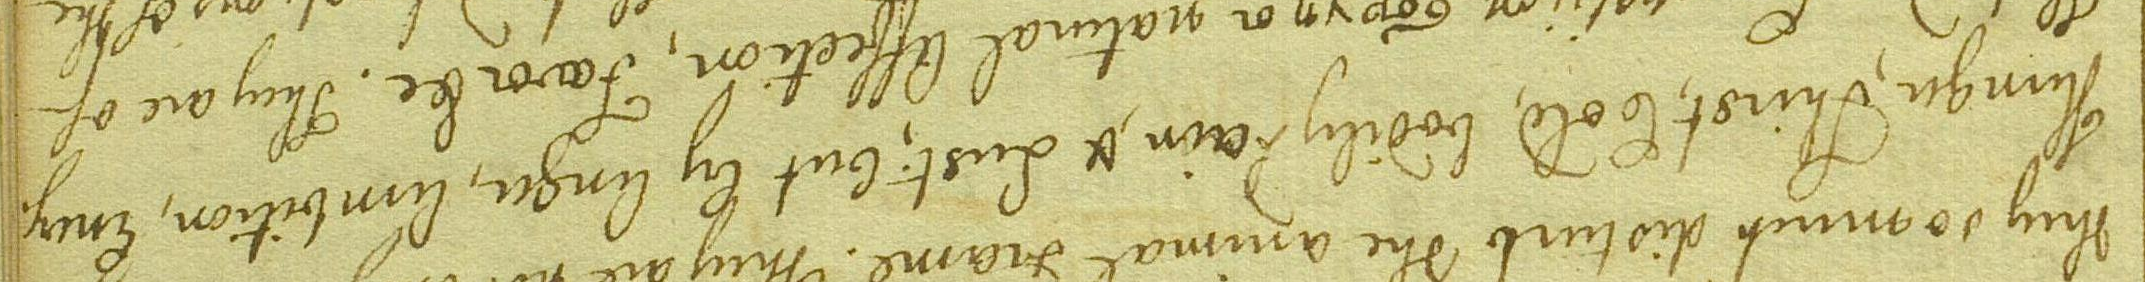Hunger, Thirst, Cold, bodily Pain, & Lust; but by Anger, Ambition, Envy,
